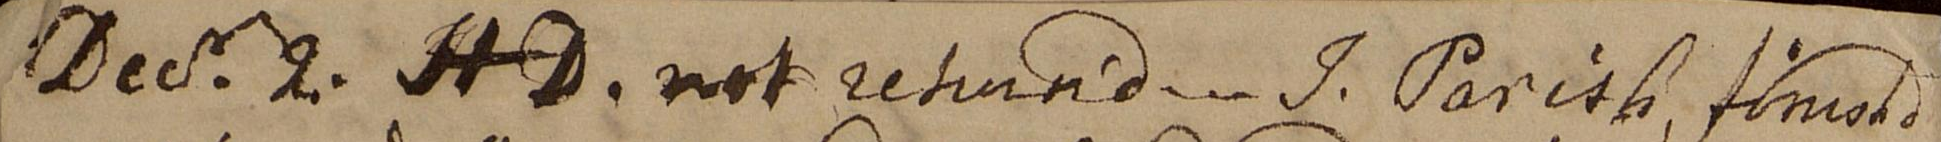Dec^r. 2. HD. not return'd-- J. Parish, finish'd
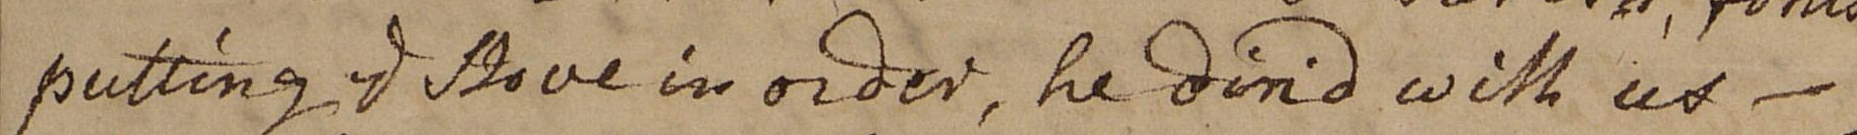putting y^e stove in order, he din'd with us-'
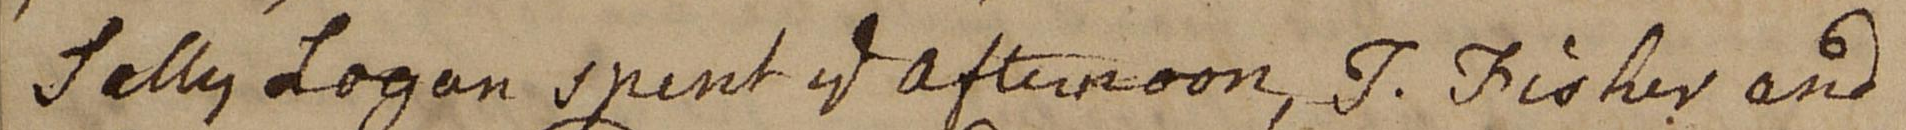Sally Logan spent y^e Afternoon, T. Fisher and
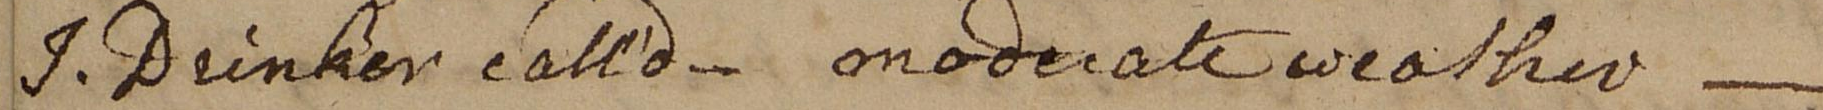I. Drinker call'd- moderate weather-
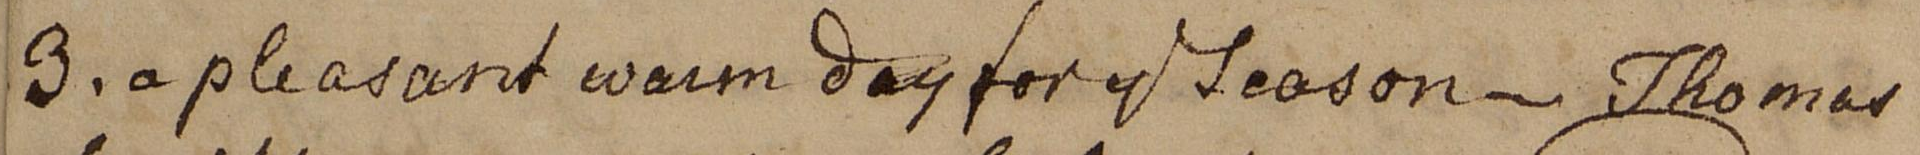3. a pleasant warm day for y^e Season- Thomas
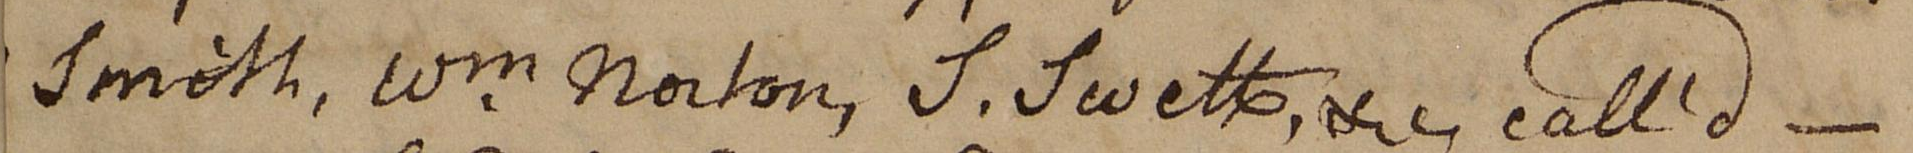Smith, W^m. Norton, S. Swett, &c call'd-
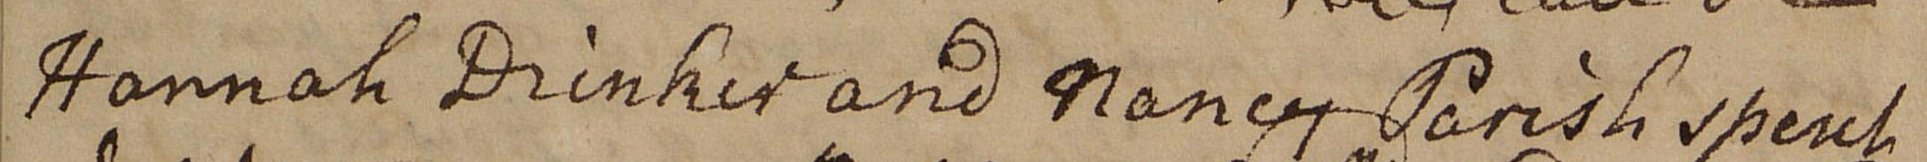Hannah Drinker and Nancy Parish spent
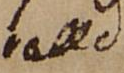call'd
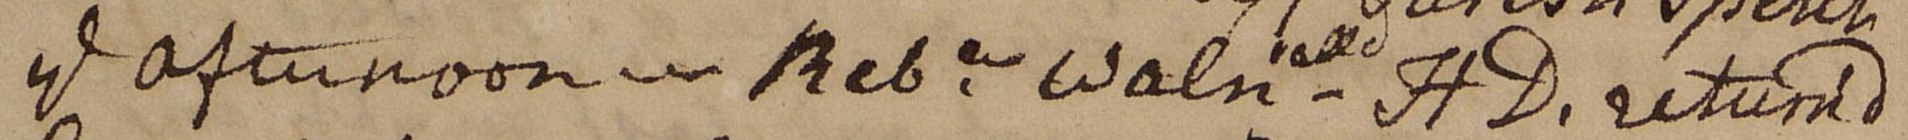y^e afternoon- Reb^a. Waln ^ - HD, return'd
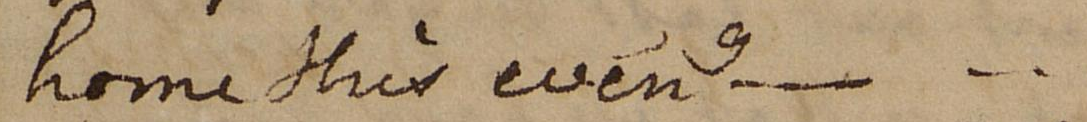home this even^g--
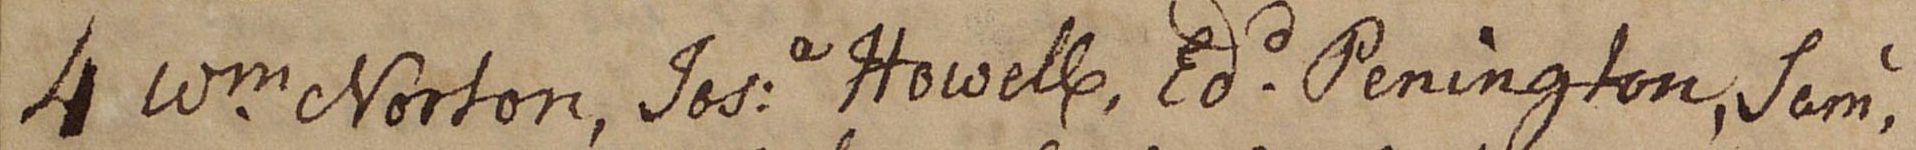4 W^m. Norton, Jos^a: Howell, Ed^d. Penington, Sam^l,
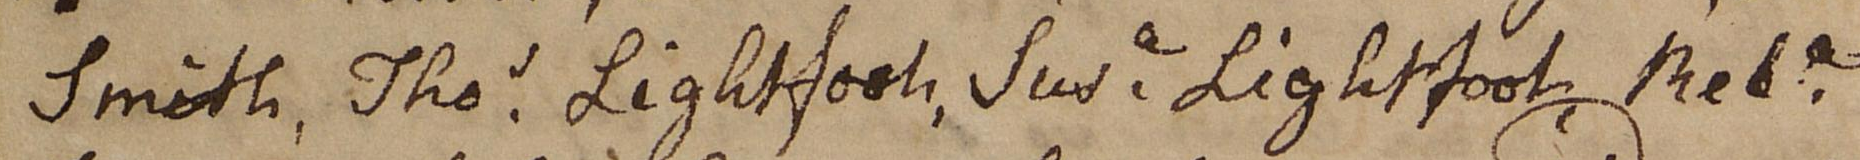Smith, Tho^s. Lightfoot, Sus^a. Lightfoot, Reb^a.
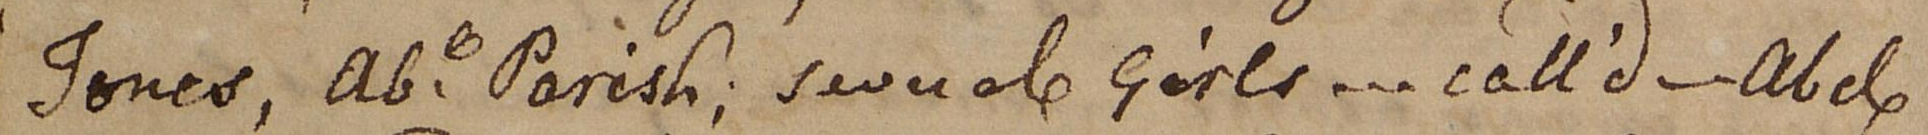Jones, Ab^l. Parish; several Girls- call'd- Abel
